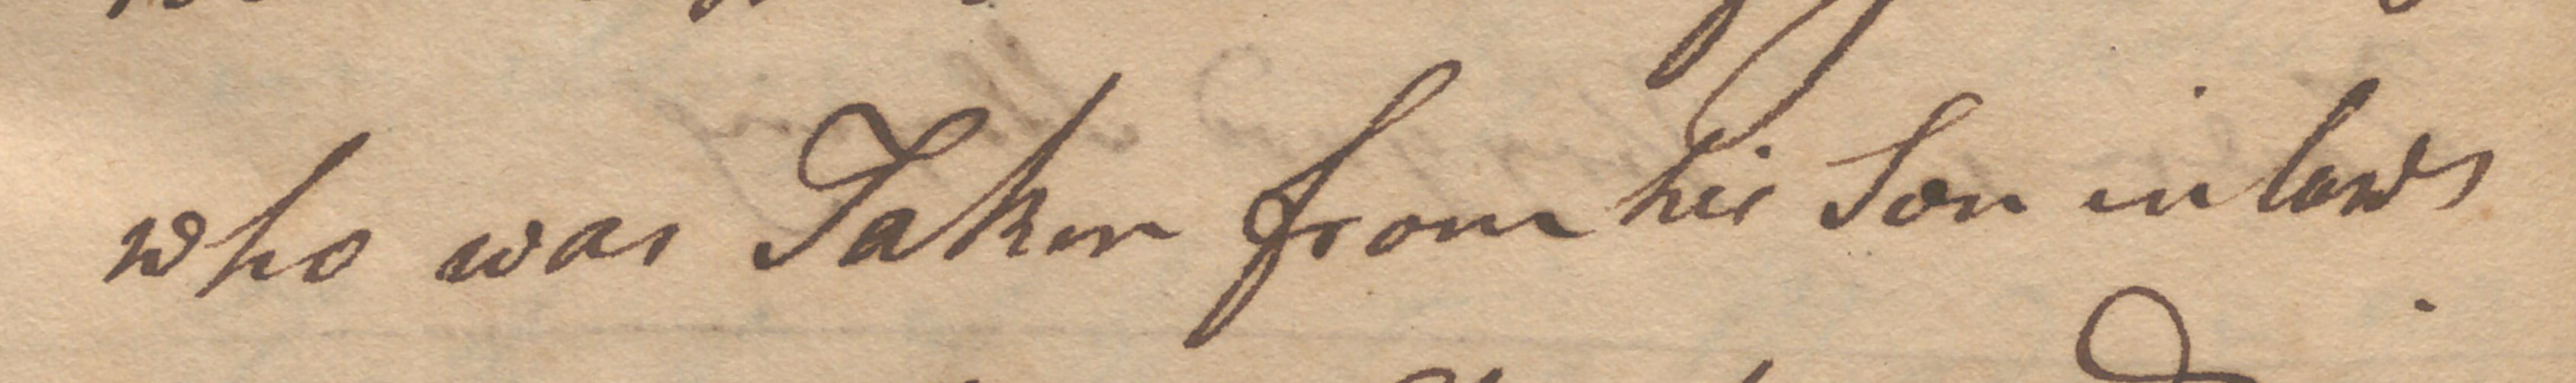who was Taken from his Son in law
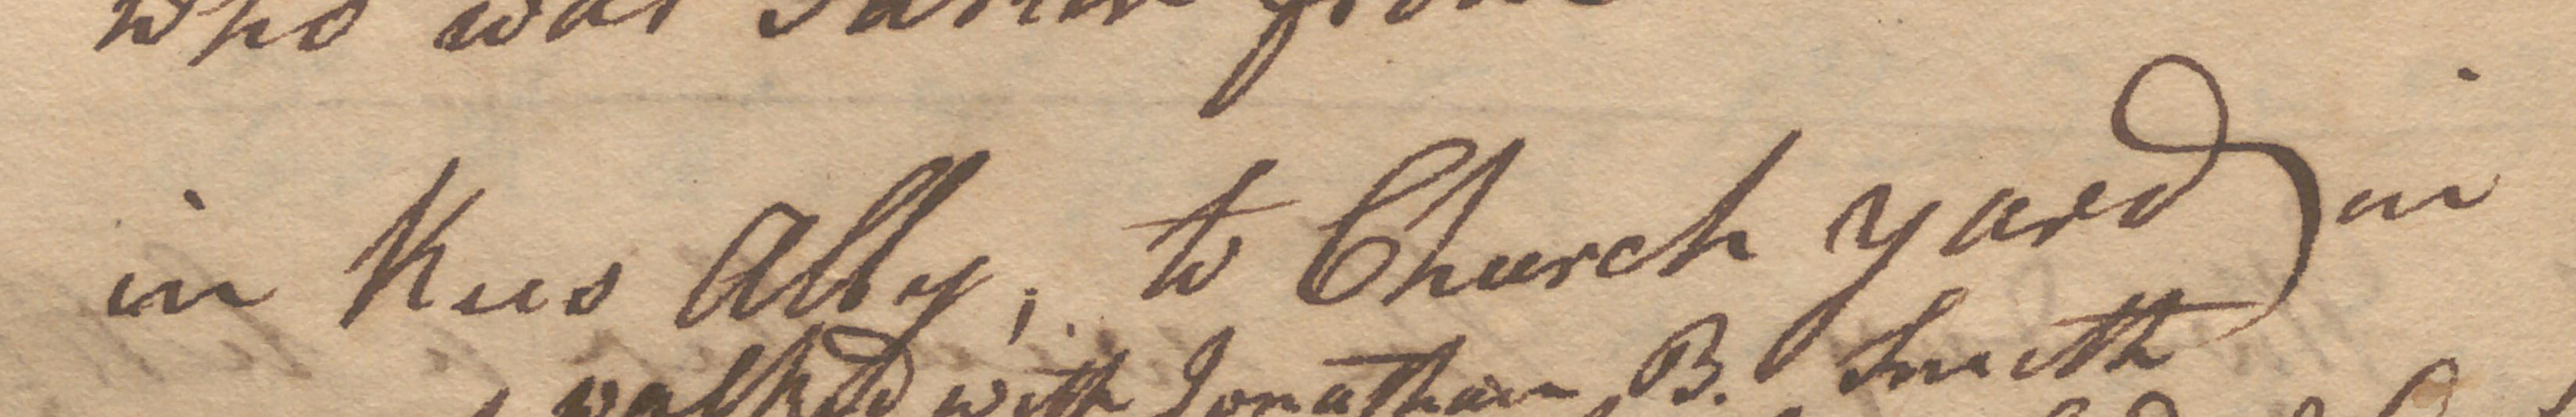in Kees Ally, to Church yard in
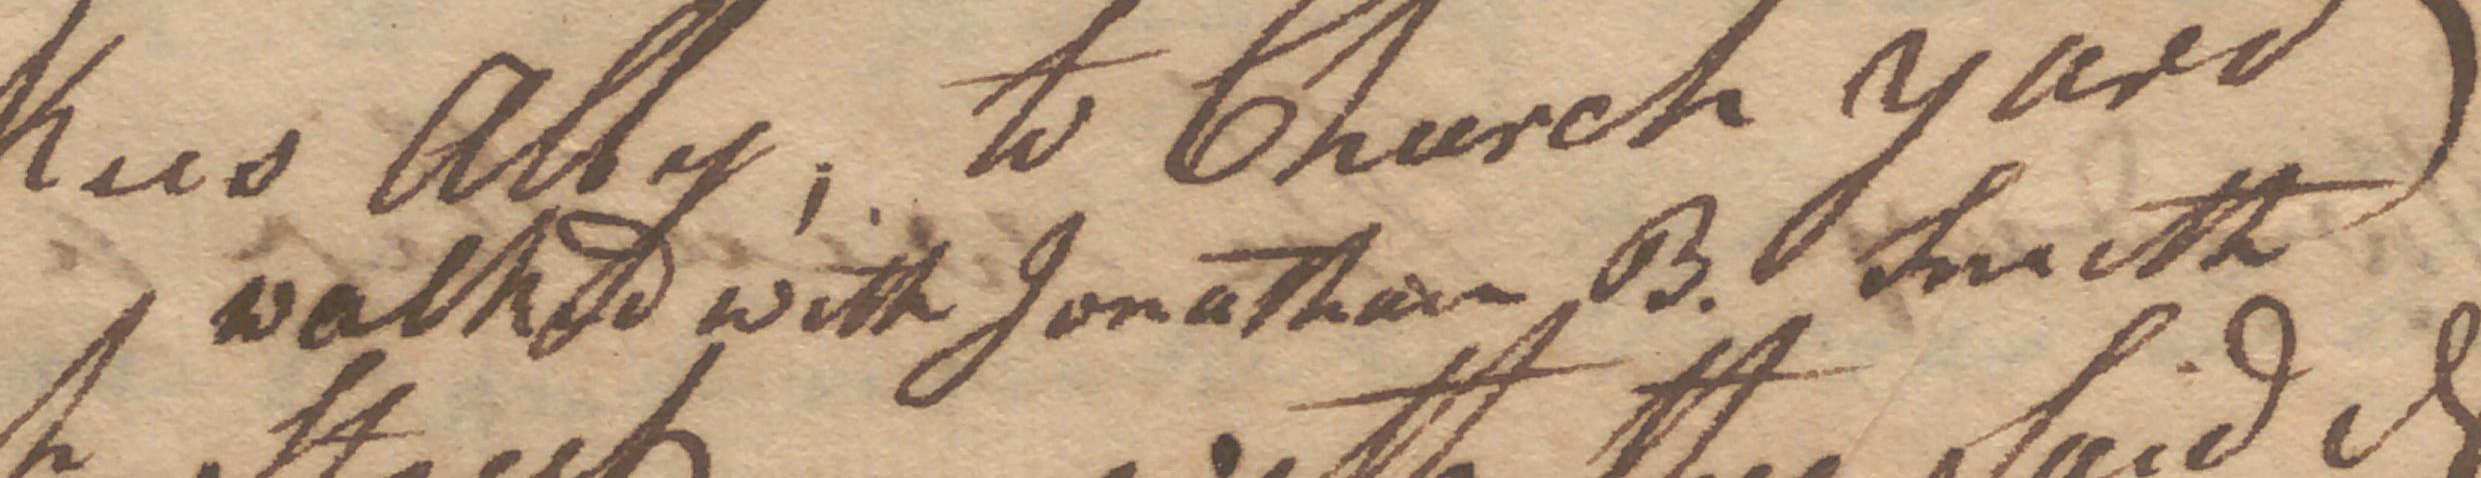walked with Jonathan B. Smith
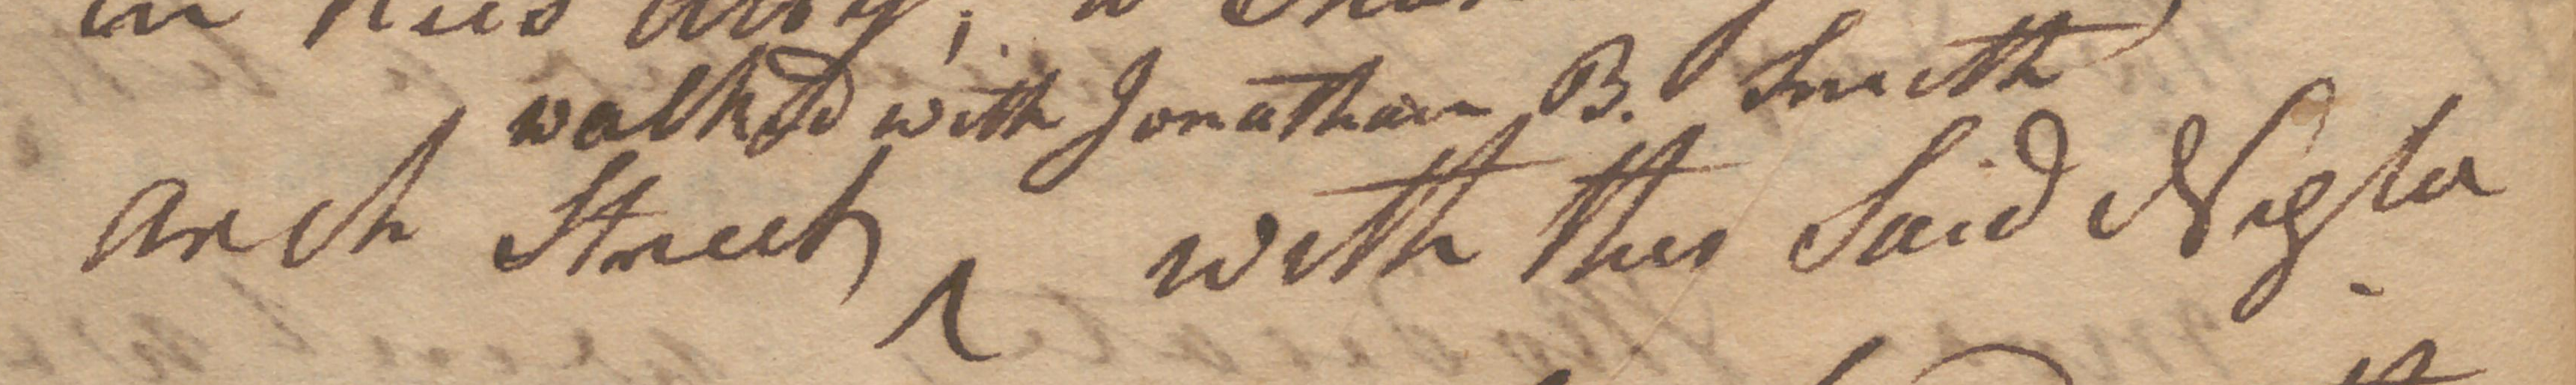Arch Street, with this Said Negler
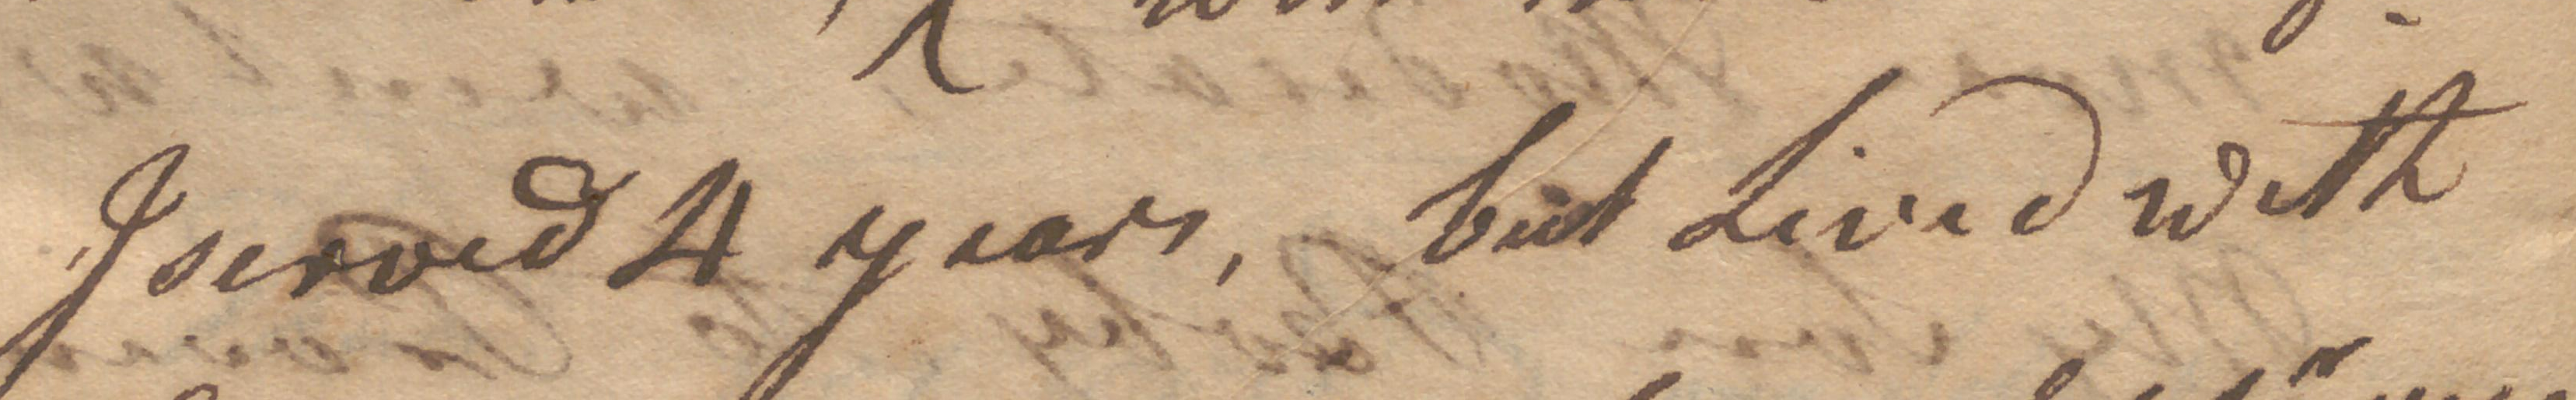I served 4 years, but Lived with
